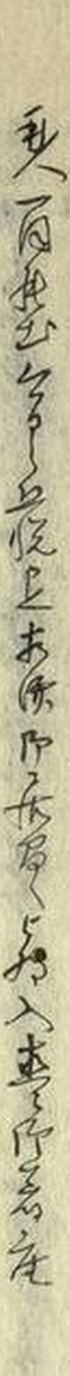用人一同罷出今日之恐悦申上相済御居間へ被為入直ニ御着座
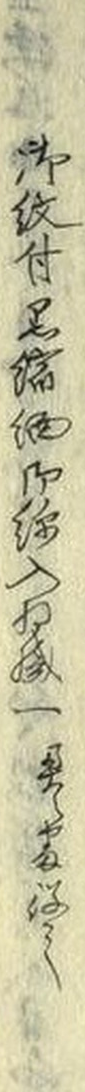御紋付黒縮緬御綿入羽織一奥之番役之右同人
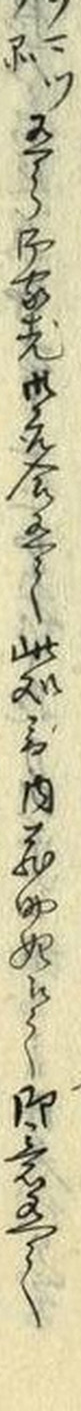ノ品有之御家老御取合有之此処ニ而内蔵助始江之御意有之
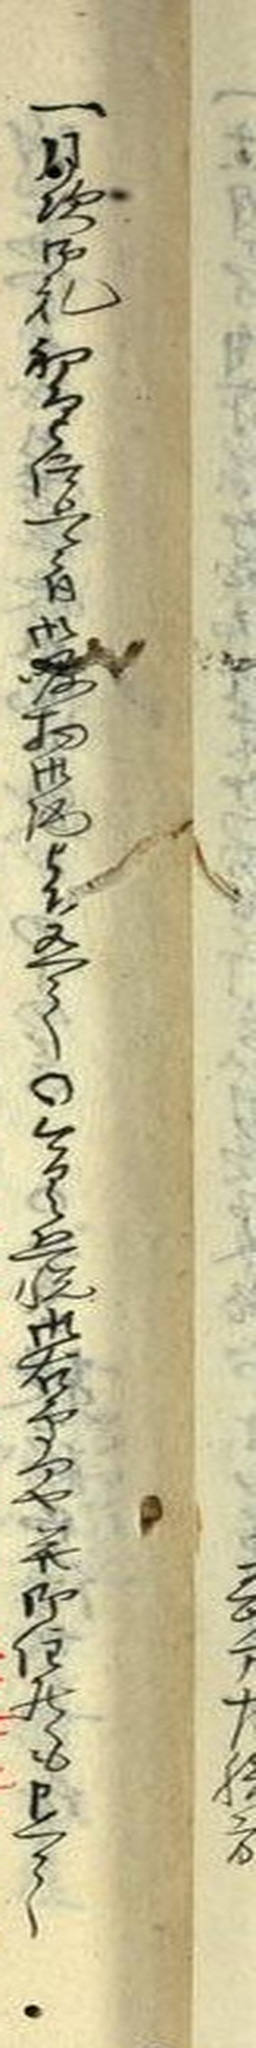一月次御礼初而被仰上候ニ付御吸物御酒被下有之〇今日之恐悦御右筆部屋幷御住居へも申上之
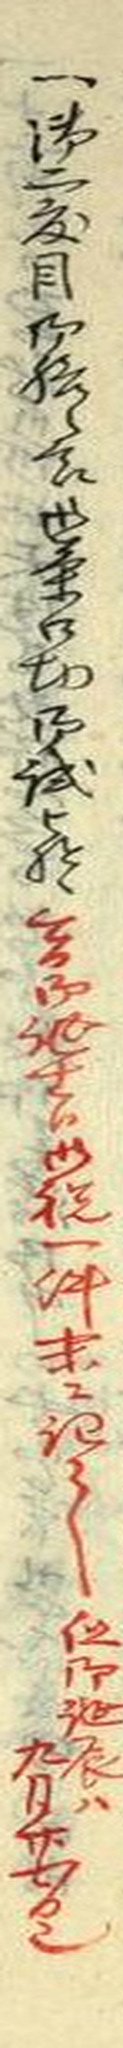一御二度目御膳之節御茶口切御試被遊候今日御誕生日御祝一件末ニ記之但御誕辰ハ九月廿五日也
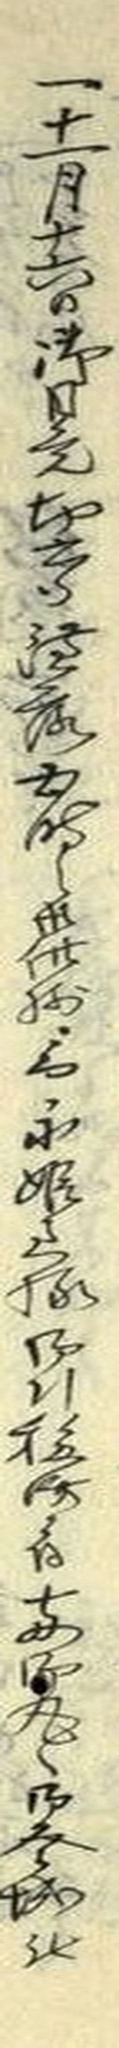一十一月十六日御目覚切六ツ鎌落五時之御供揃ニ而永姫君様御引移済ニ付両御丸へ御登城被
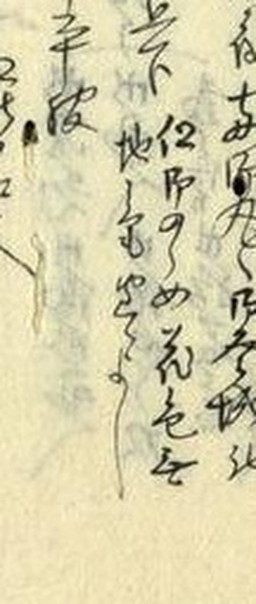地ニ而も宜候よし
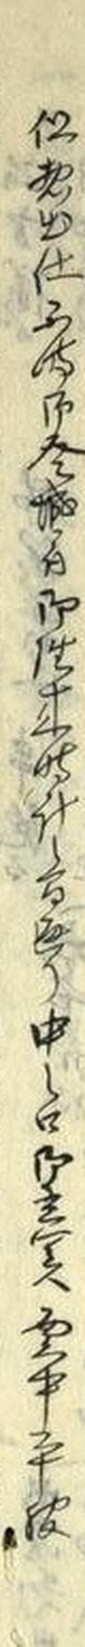但惣出仕不時御登城ニ付御往来時計之間通り中之口御玄関殿中平服
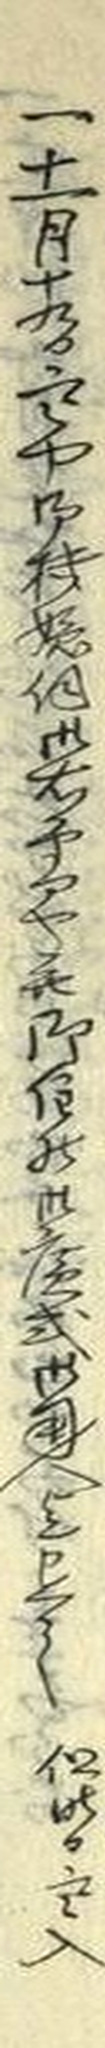一十一月十九日寒中御機嫌伺御右筆部屋幷御住居御広式御用人迄申上之但昨日寒入
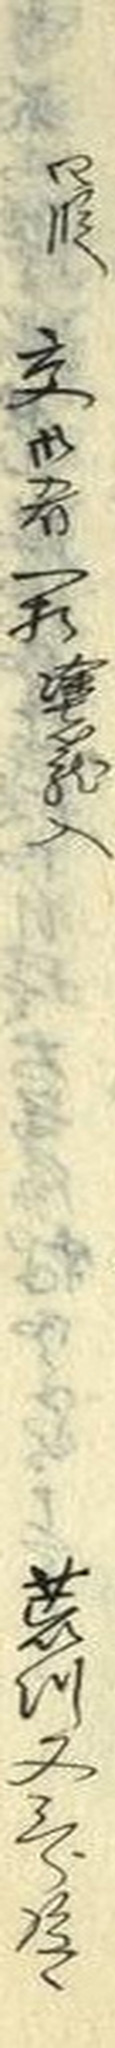四段交御肴一折塗籠入荒川又三郎殿へ
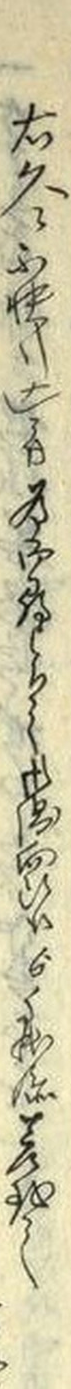右久々不快引込ニ付為御尋被下之御側向頭取ゟ手紙添差越之
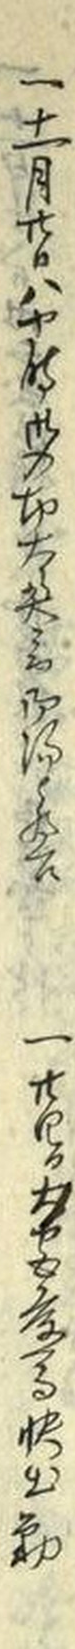一十一月廿日八半時御〆切大奥ニ而御湯被為召一廿四日ゟ大宮藤馬快出勤
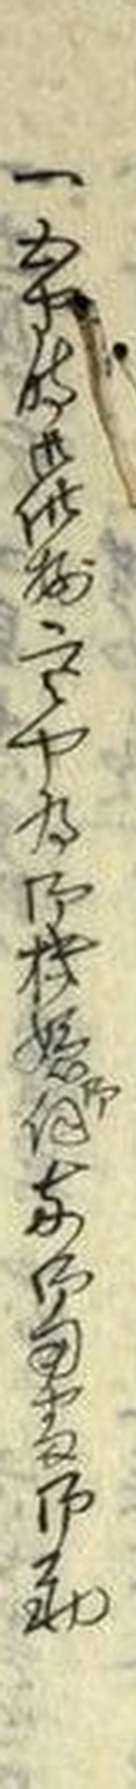一五半時御供揃寒中為御機嫌御伺両御用番御勤

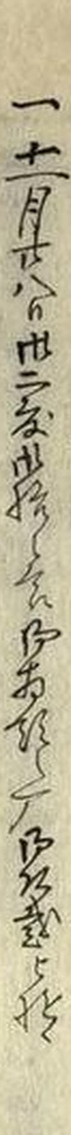一十一月廿八日御二度御膳之節御拝領之雁御頂戴被遊候
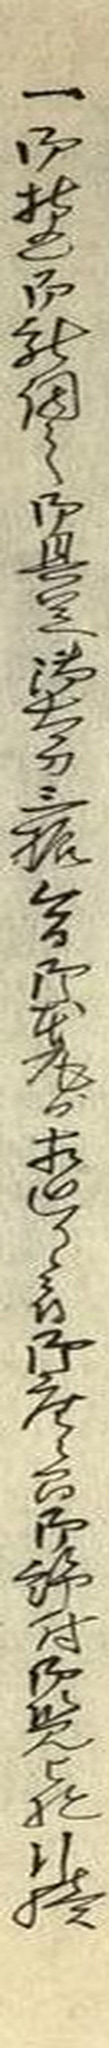一御持込御新調之御具足御太刀三振今日御本丸ゟ相廻り候ニ付御座之間御飾付御覧被遊引続
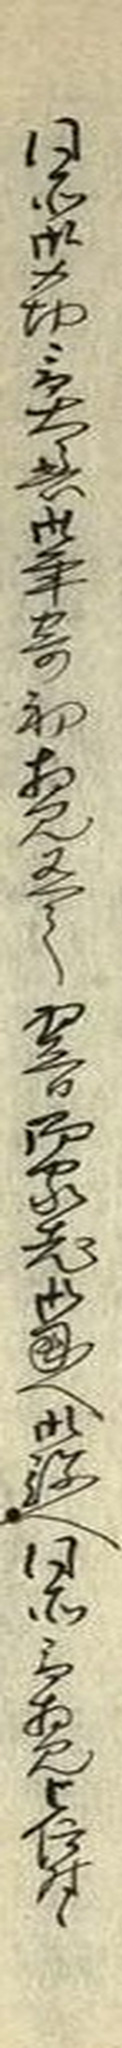同所御〆切ニ而大奥御年寄初拝見有之翌日御家老御用人御役人同所ニ而拝見被仰付候
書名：少傅日録抄（斉善付側向頭取日記、在府）
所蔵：福井県文書館 Fukui Prefectural Archives
